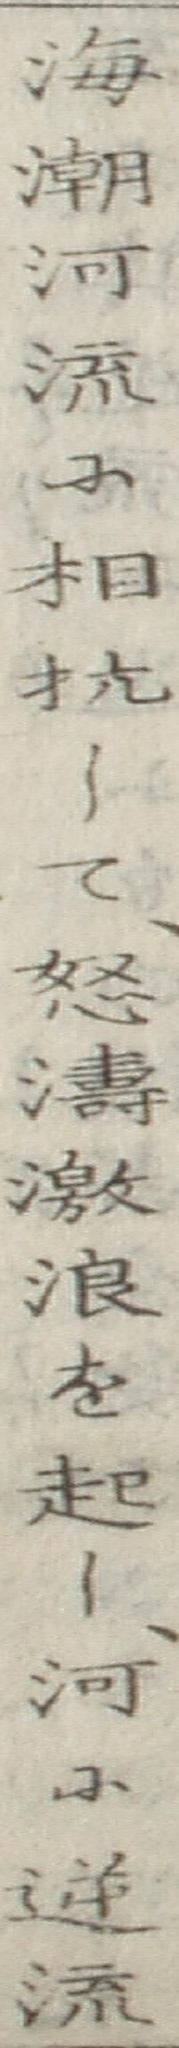海潮河流に相抗して、怒涛激浪を起し、河に逆流
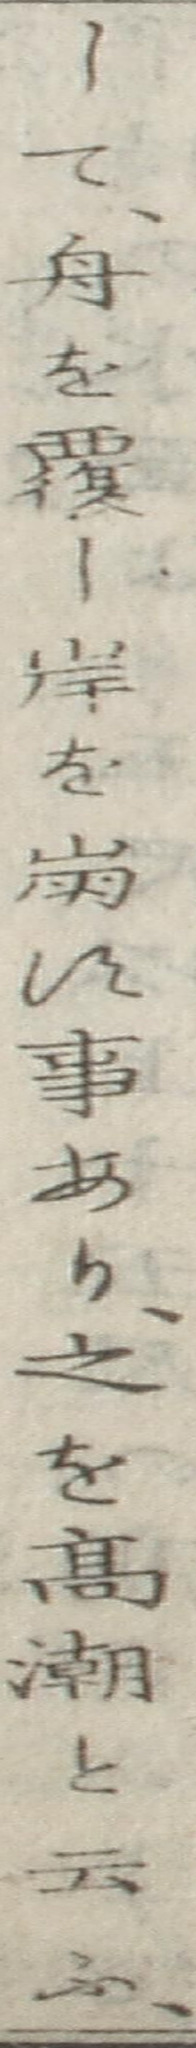して、舟を覆し岸を崩す事あり、之を高潮と云ふ、

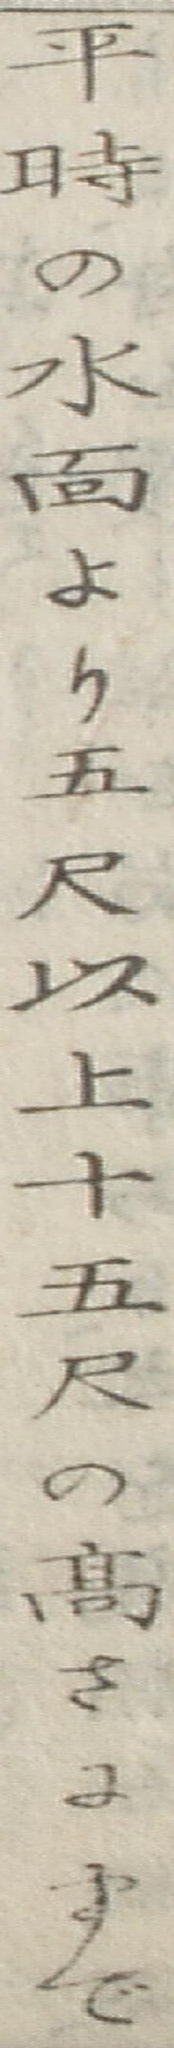平時の水面より五尺以上十五尺の高さにまで
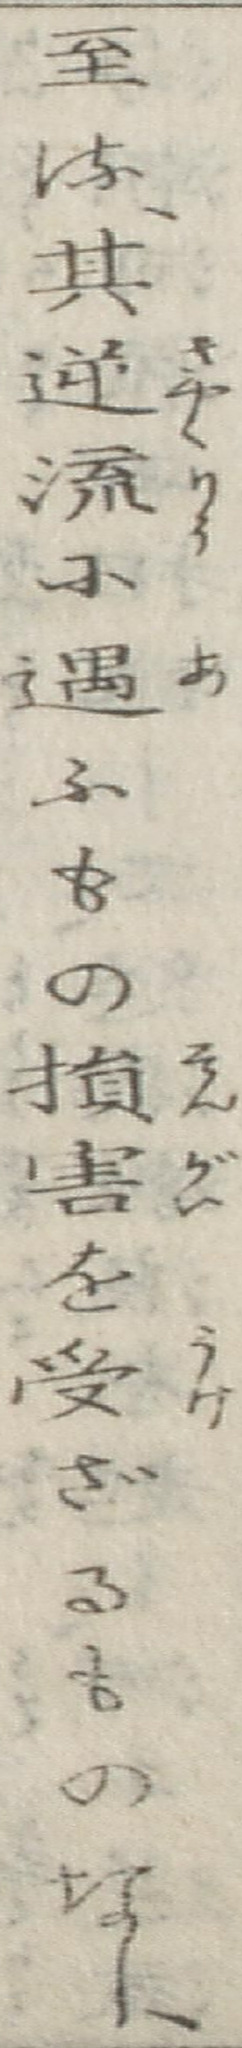至る、其逆流に遇ふもの損害を受ざるものなし、
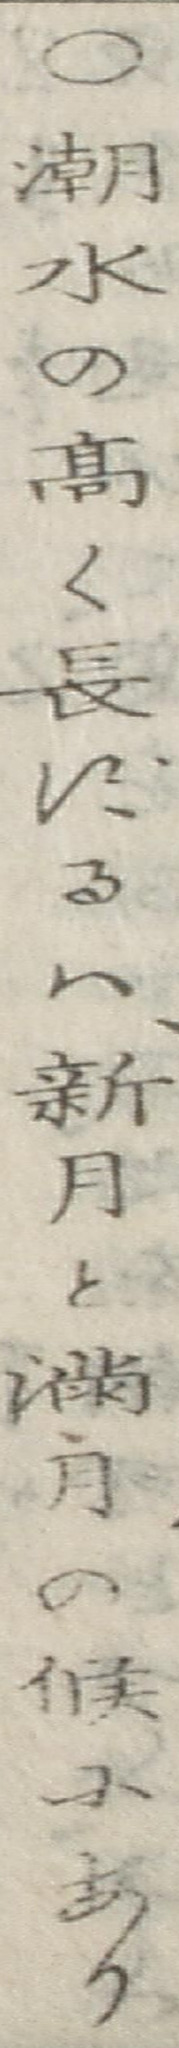〇潮水の高く長ずるは、新月と満月の候にあり
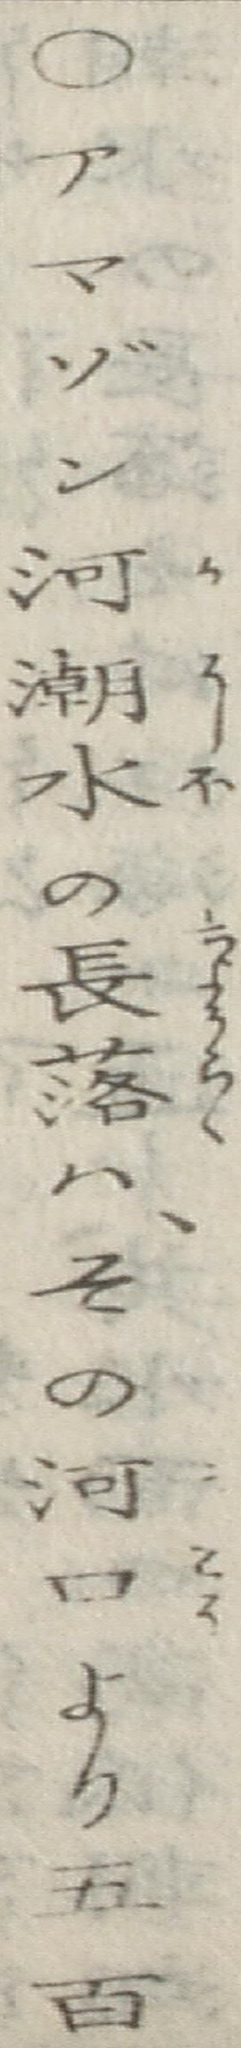〇アマゾン河潮水の長落は、その河口より五百
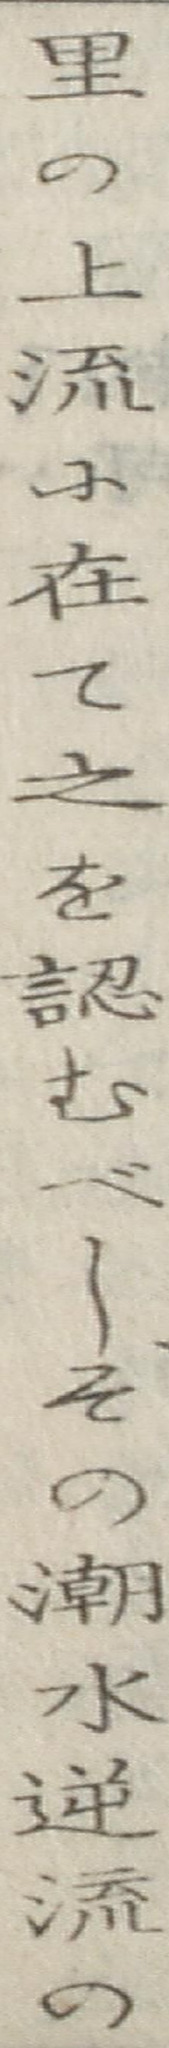里の上流に在て之を認むべし、その潮水逆流の
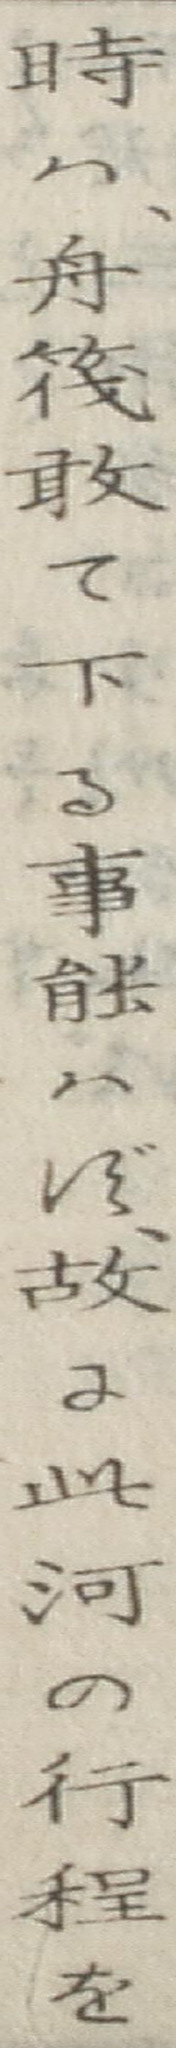時は、舟筏敢て下る事能はず、故に此河の行程を
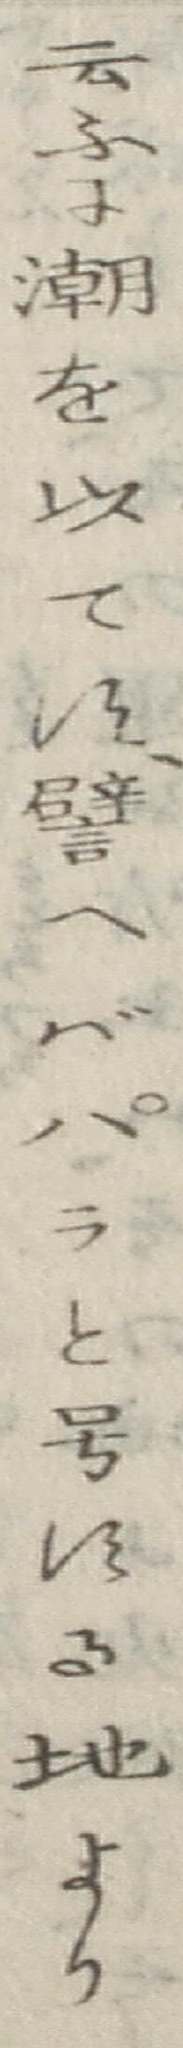云ふに潮を以てす、譬へばパラと号する地より
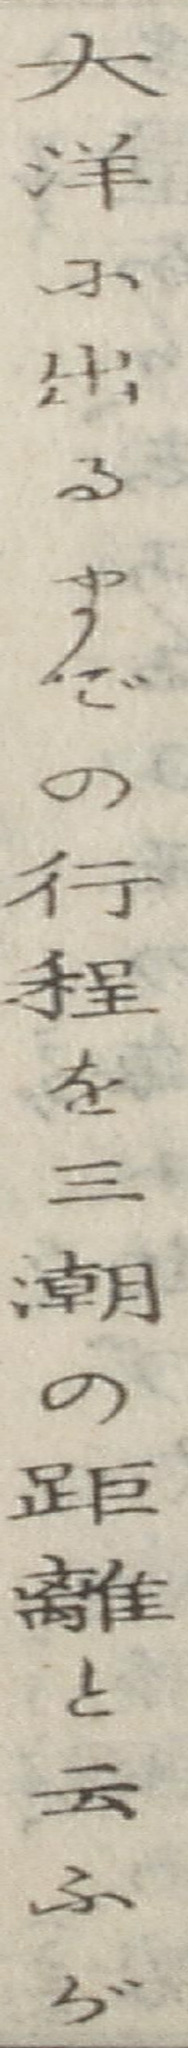大洋に出るまでの行程を三潮の距離と云ふが
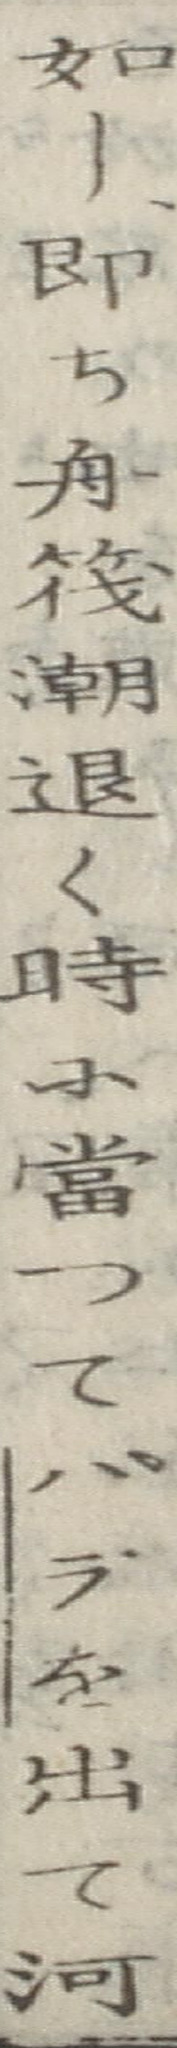如し、即ち舟筏潮退く時に当つてパラを出て河
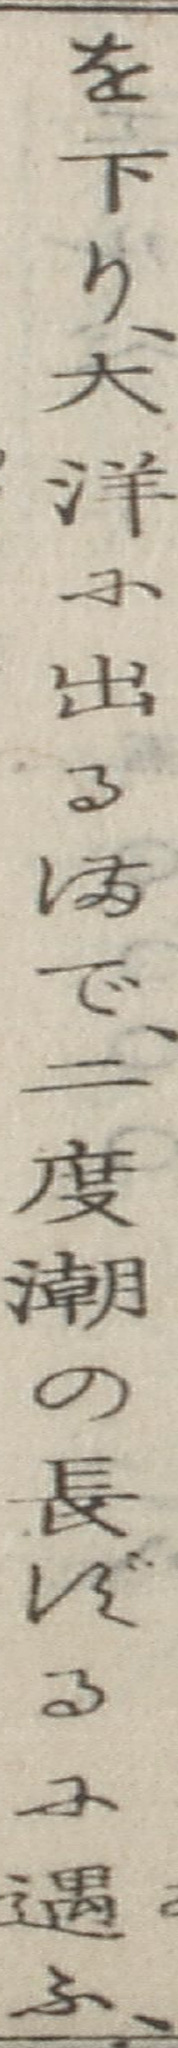を下り、大洋に出るまで、二度潮の長ずるに遇ふ、
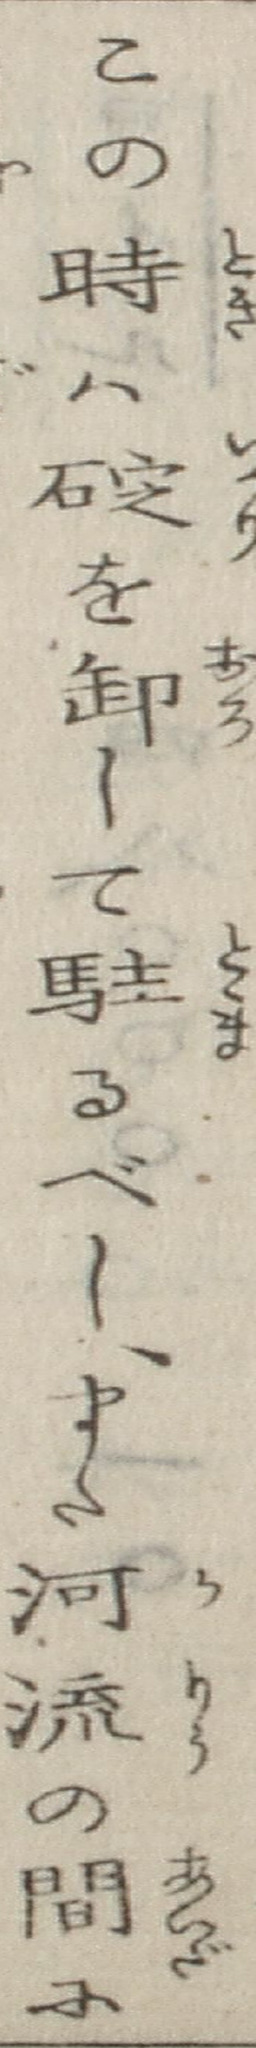この時は碇を卸して駐るべし、また河流の間に
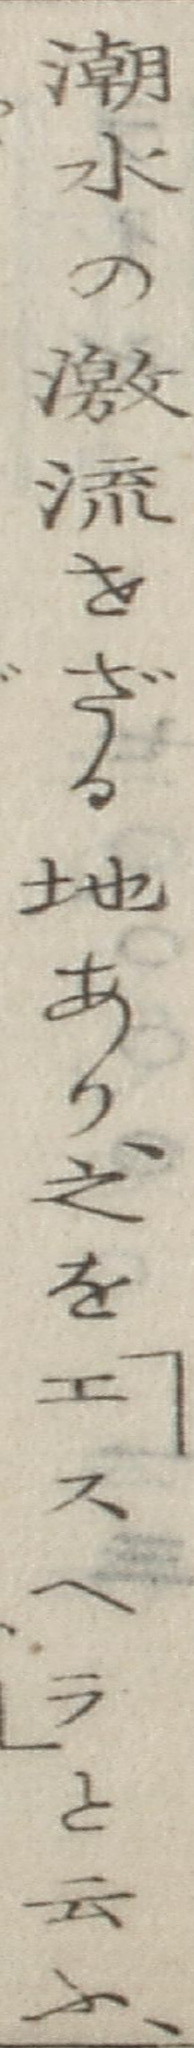潮水の激流せざる地あり、之を「エスヘラ」と云ふ、
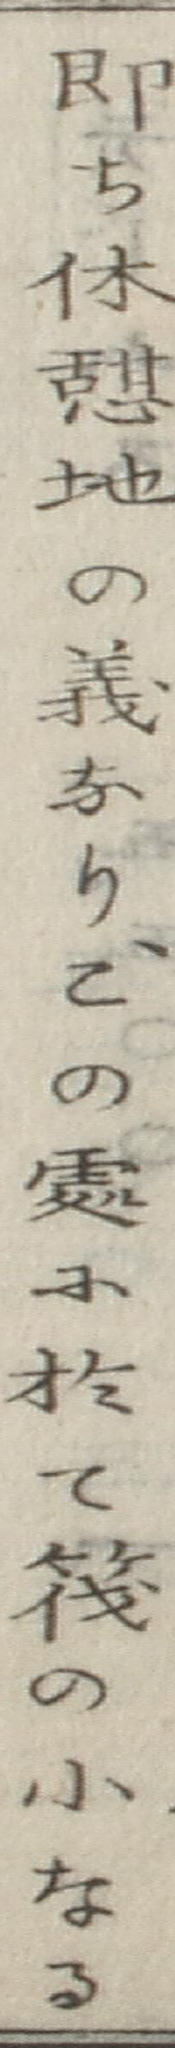即ち休憩地の義なり、この處に於て筏の小なる
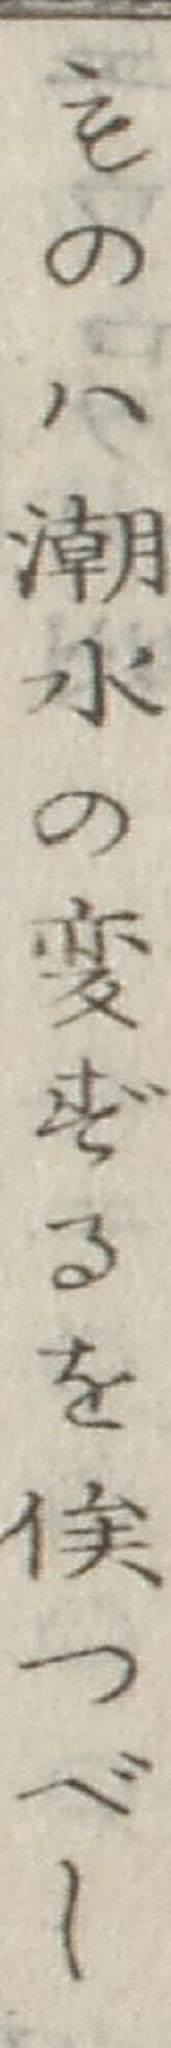ものは潮水の変ずるを俟つべし
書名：訓蒙　天然地理學　中
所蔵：東京大学地震研究所図書室 Earthquake Research Institute Library, The University of Tokyo, JAPAN
